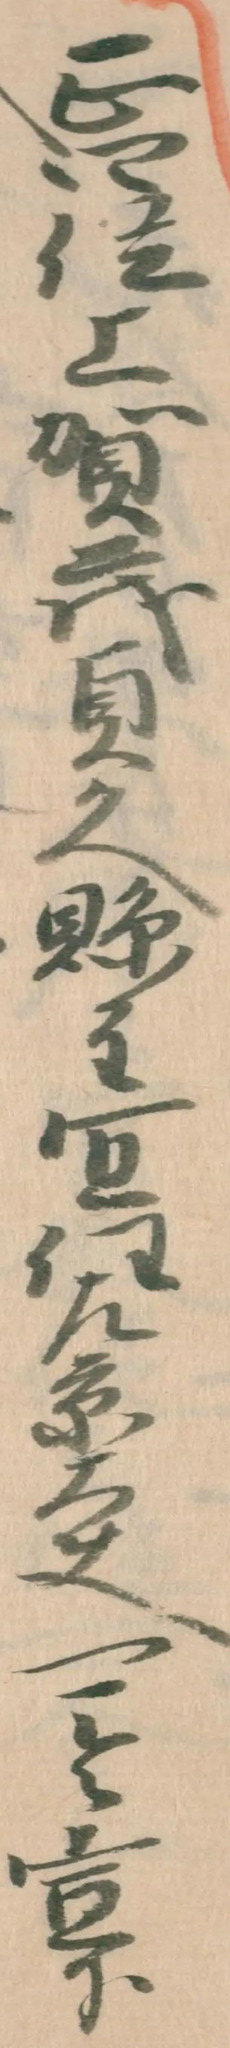正四位上賀茂貞久県主宜任左京大夫可令宣下
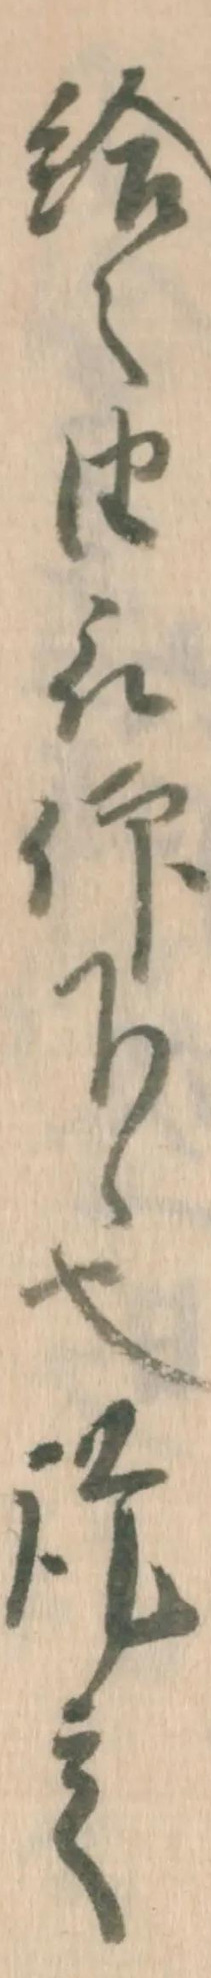給之由被仰下候也謹言
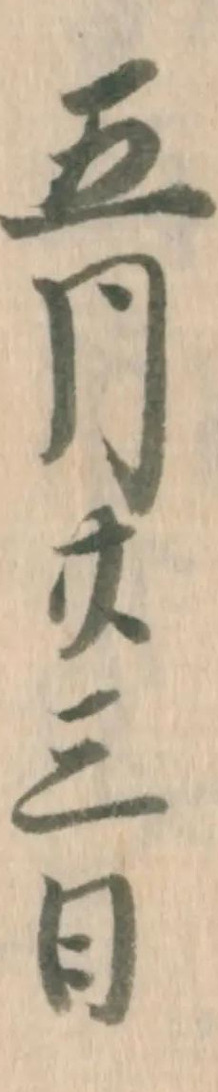五月廿三日
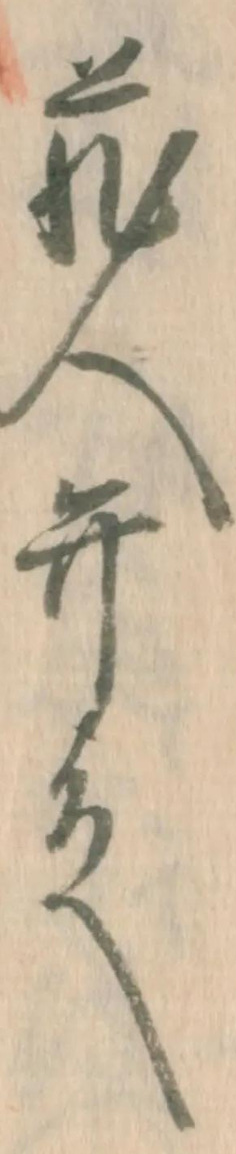蔵人弁殿
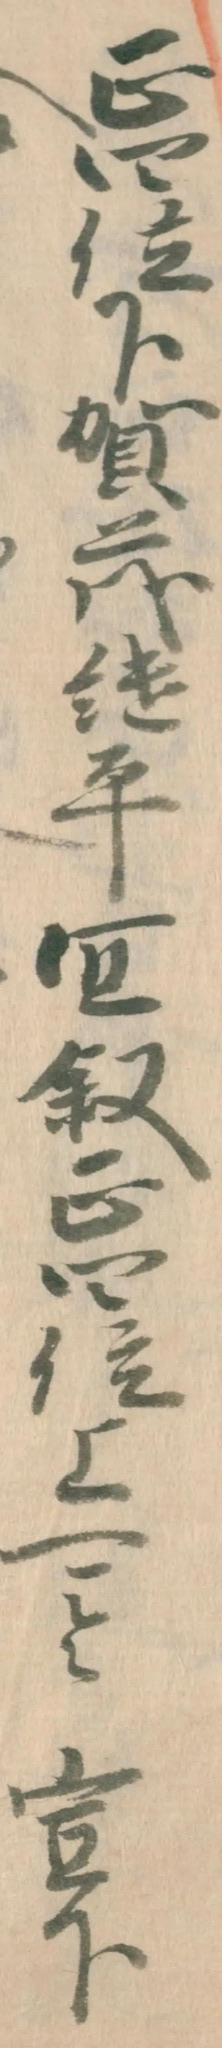正四位下賀茂継平宜叙正四位上可令宣下
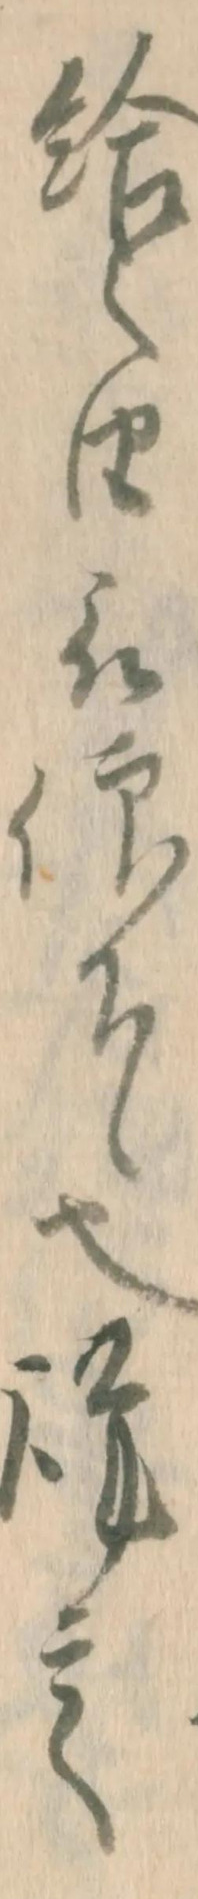給之由被仰下候也謹言
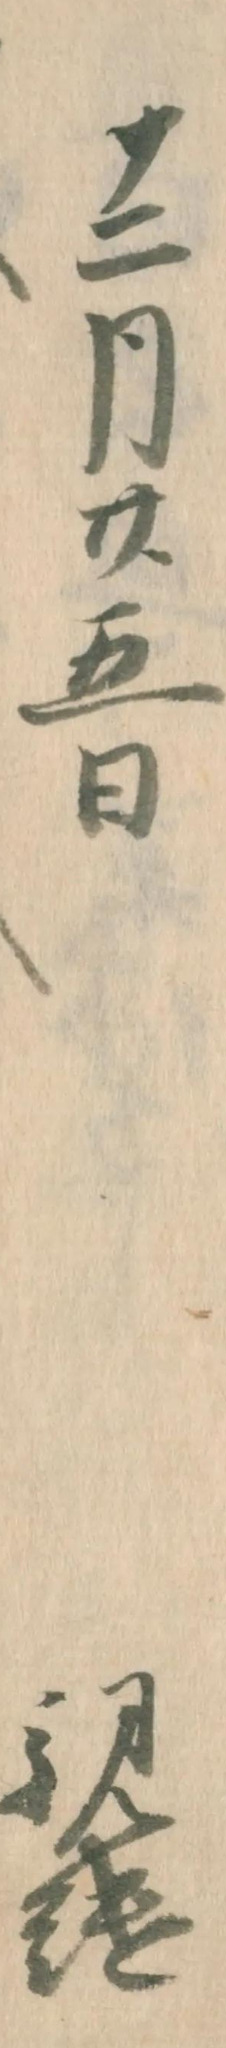十二月廿五日親継

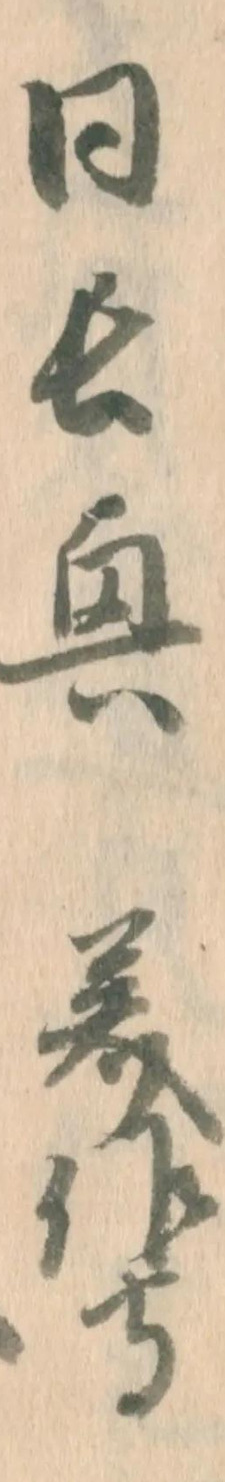同長興美作守
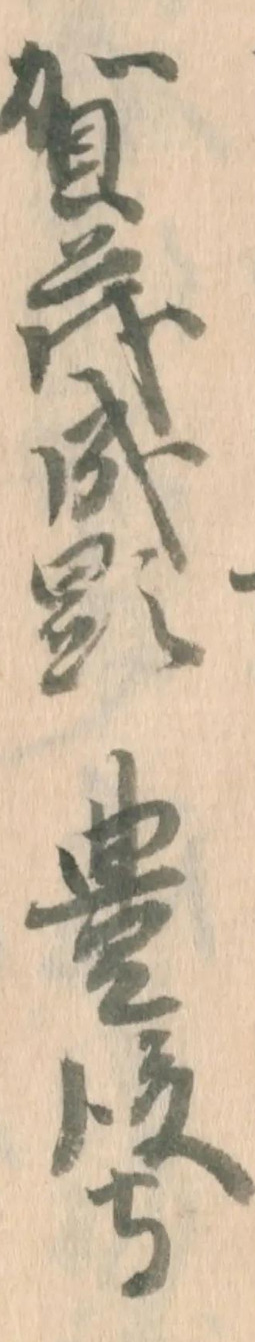賀茂成顕豊後守
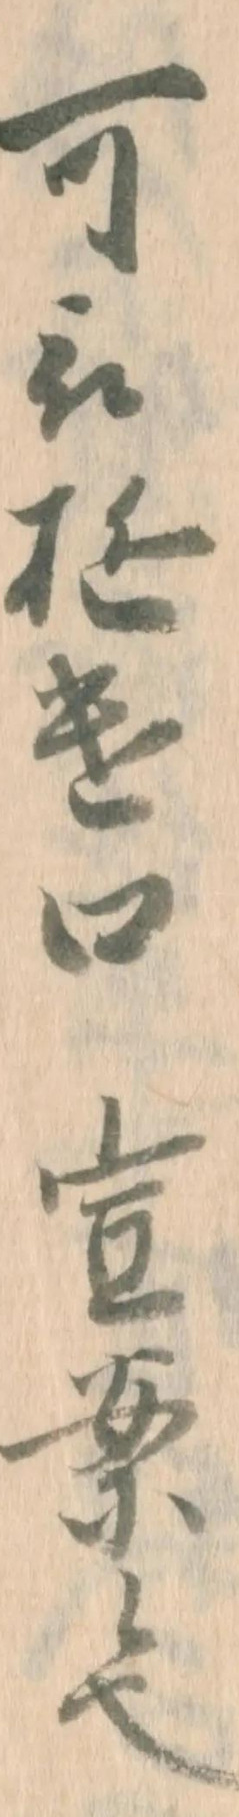可被遊遣口宣案候也
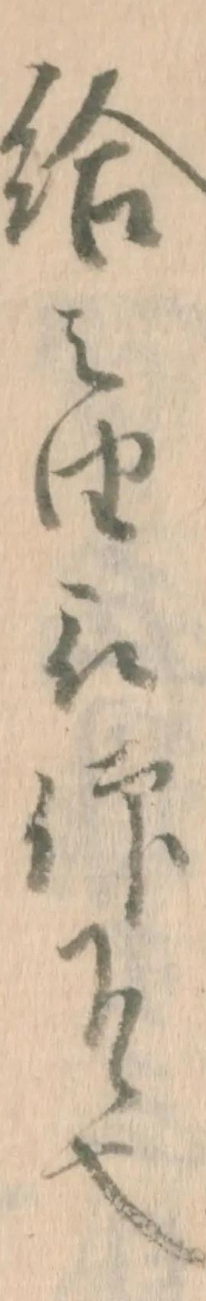給之由被仰下候也
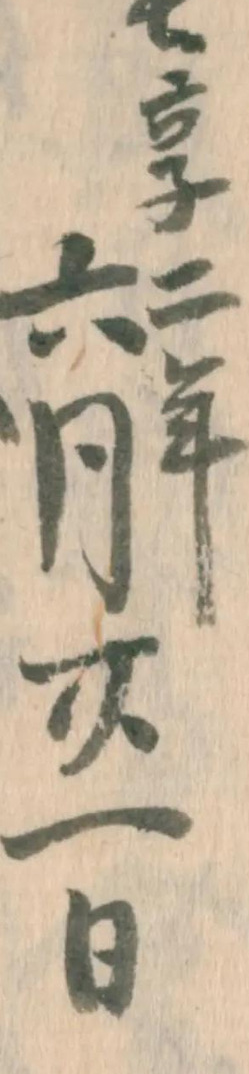六月廿一日
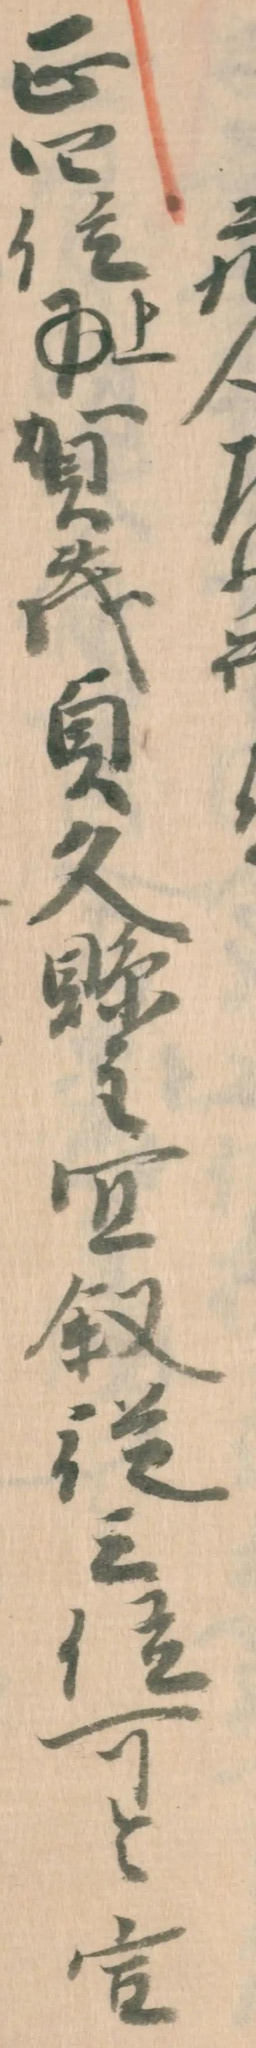正四位下賀茂棟久県主宜叙従三位可令宣
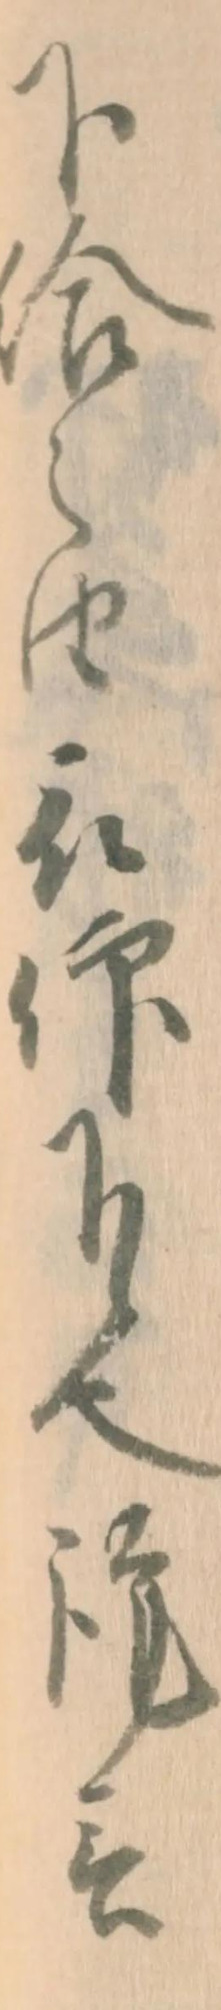下給之由被仰下候也謹言
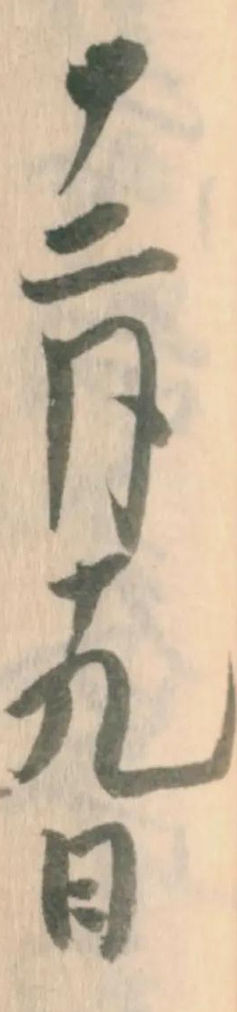十二月十九日
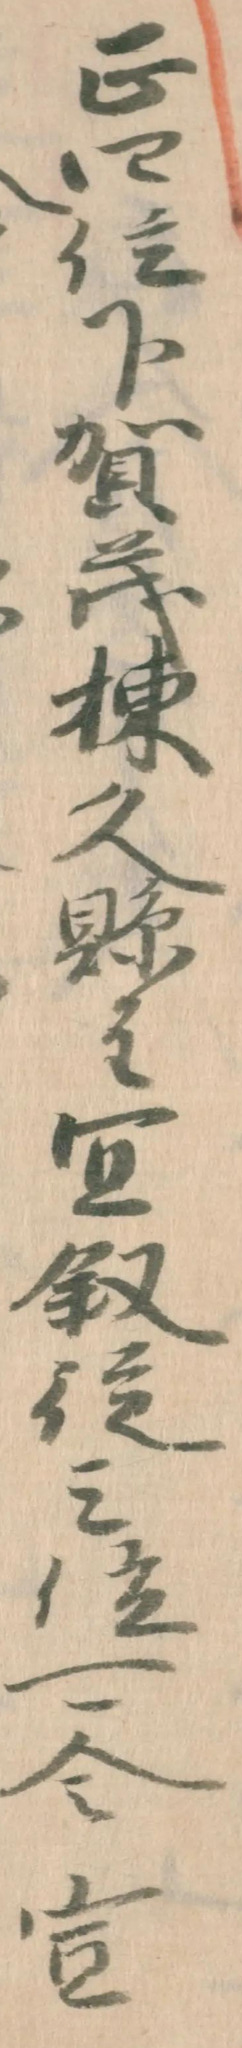正四位下賀茂棟久県主宜叙従三位可令宣
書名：賀茂社記録. 第1冊
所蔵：国立国会図書館 National Diet Library, JAPAN
